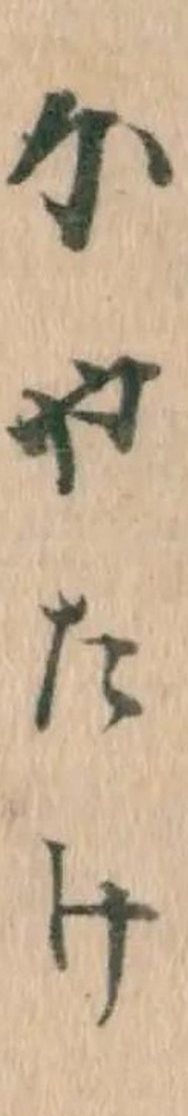かやたけ
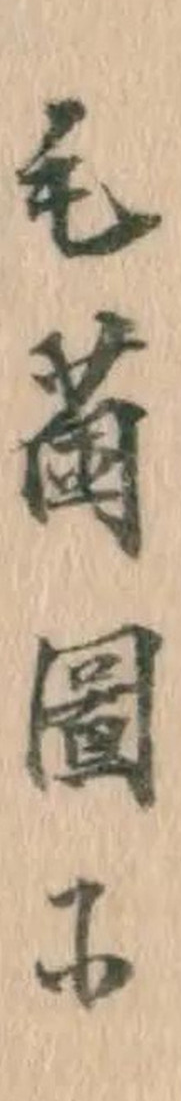毛菌図に
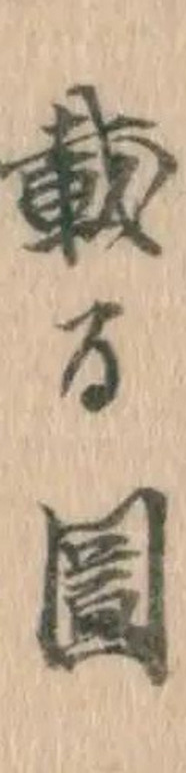載る図

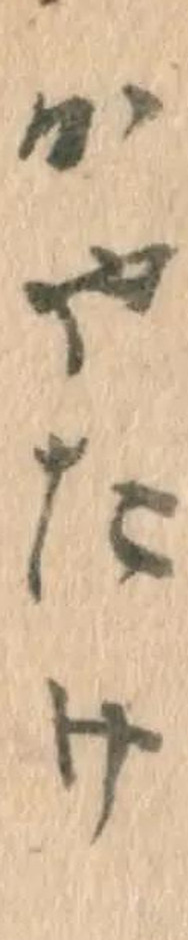かやたけ
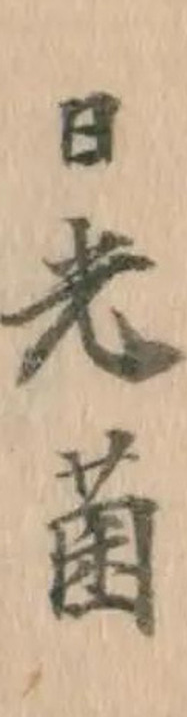日光菌
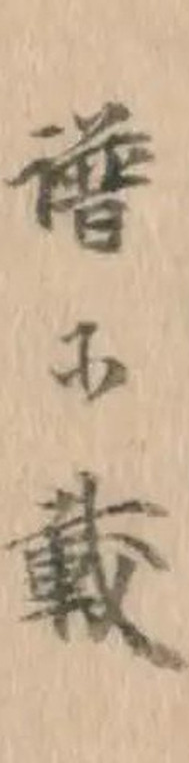譜に載

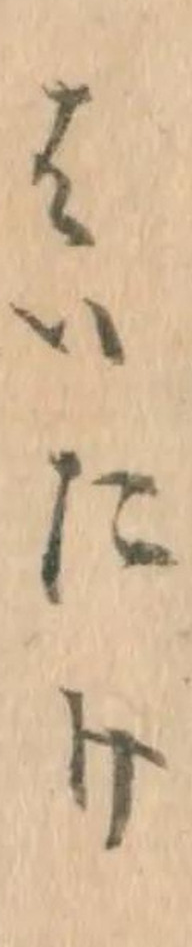はいたけ
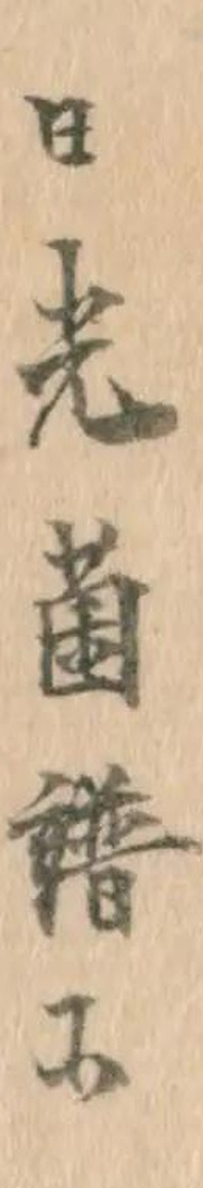日光菌譜に
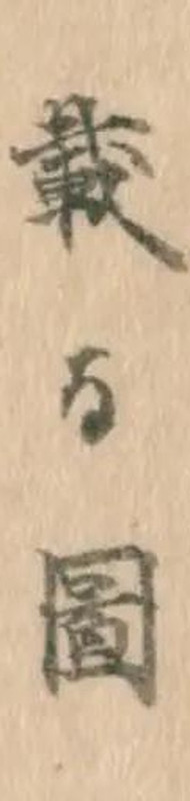載る図
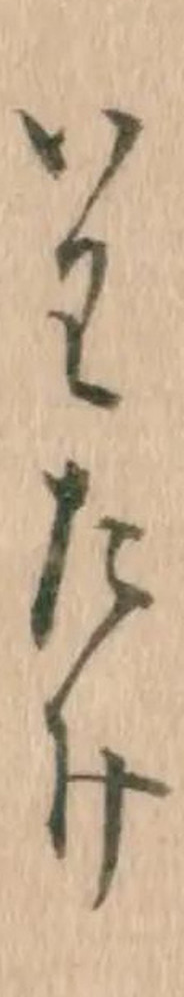いわたけ
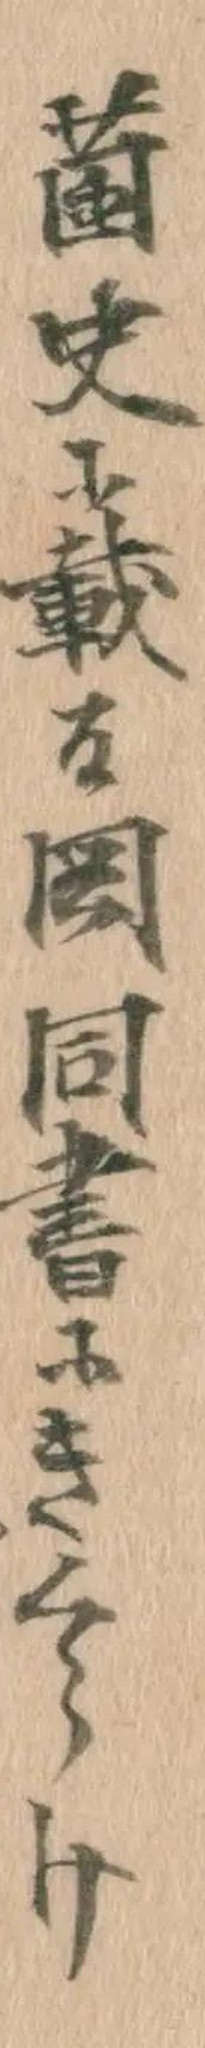菌史に載る図同書にきくらけ
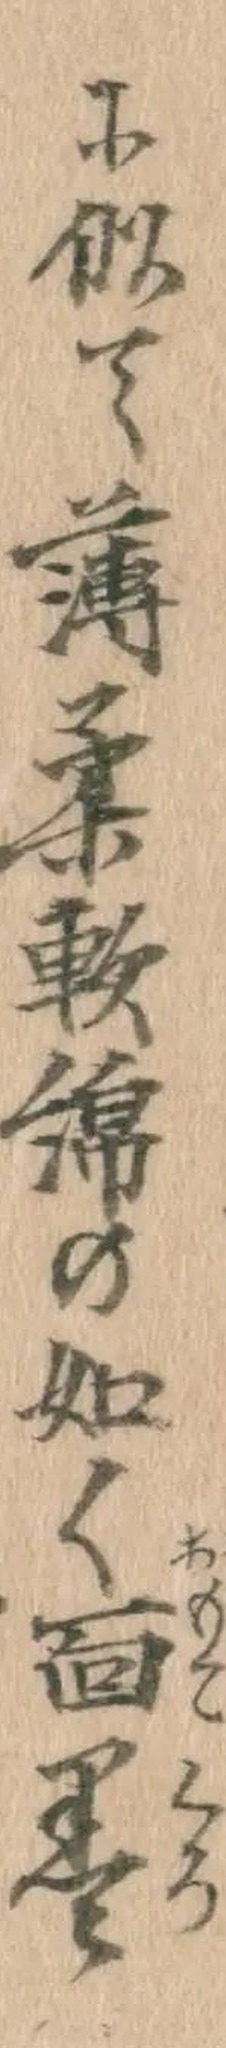に似て薄柔軟綿の如く面墨
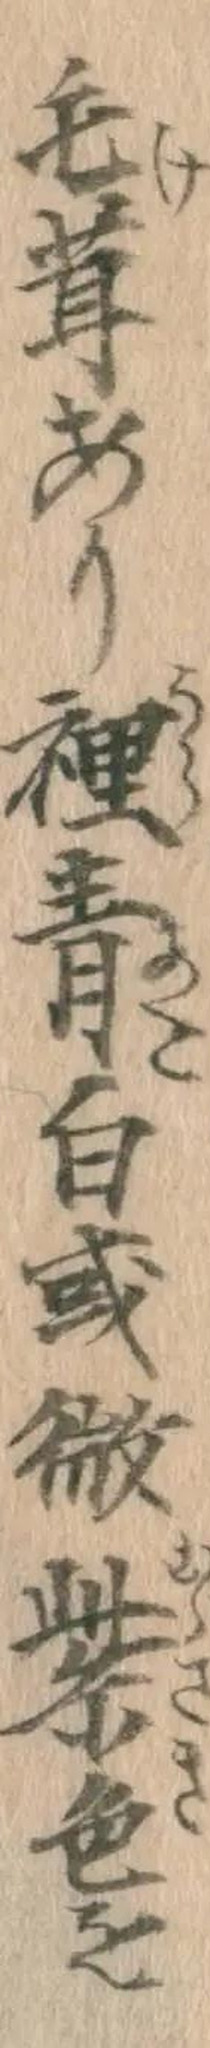毛茸あり裡青白或微紫色を
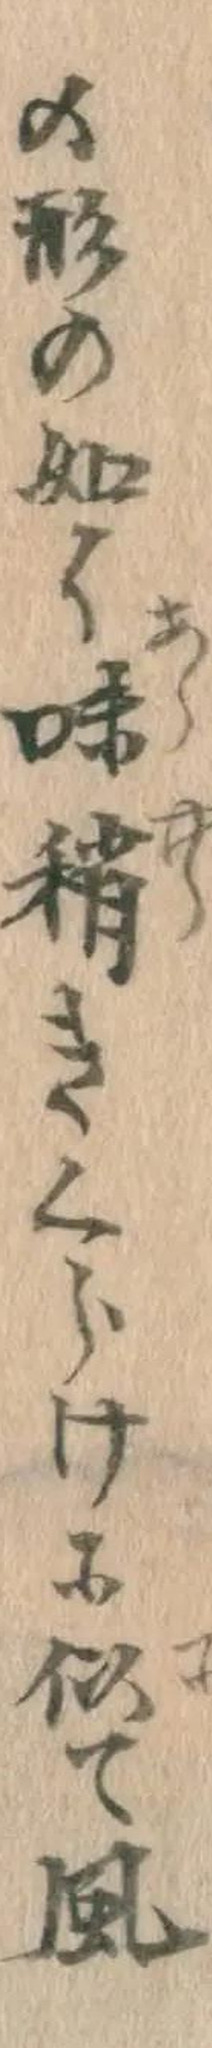の形の如く味稍きくらけに似て風
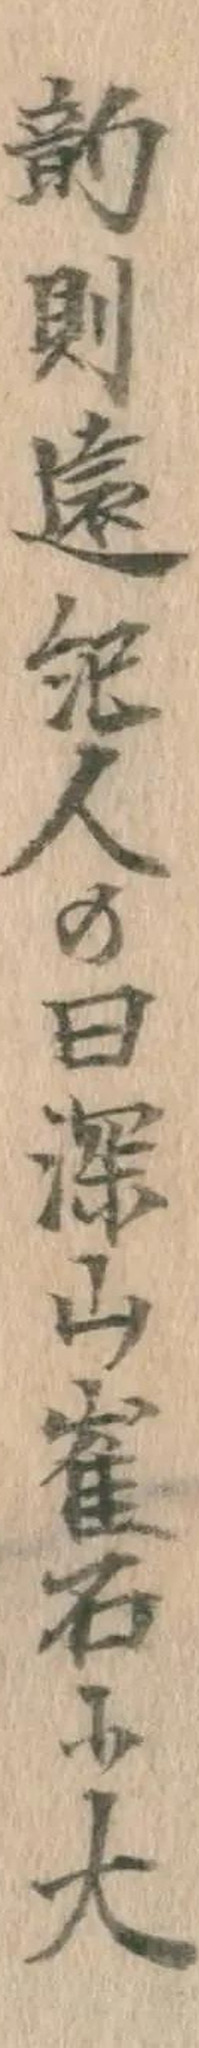韻則遠紀人の曰深山崔石に大
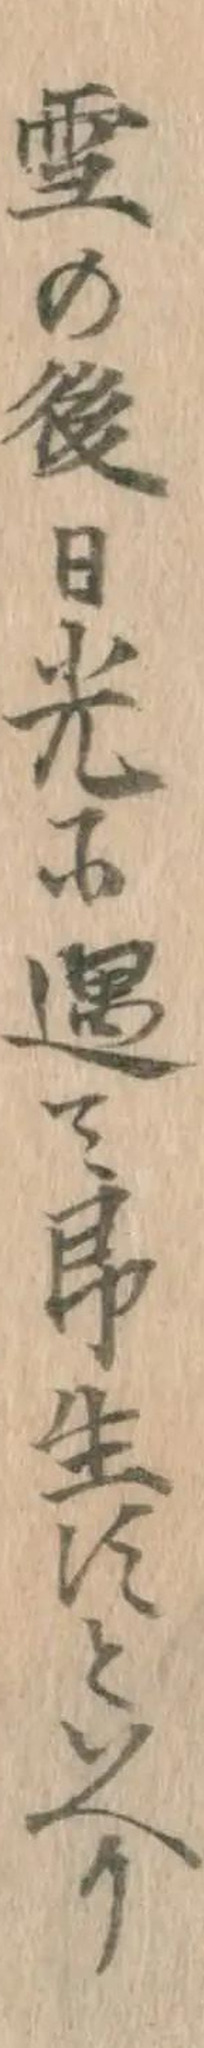雪の後日光に遇て即生すといへり
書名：本草図譜. 巻58-60
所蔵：国立国会図書館 National Diet Library, JAPAN
